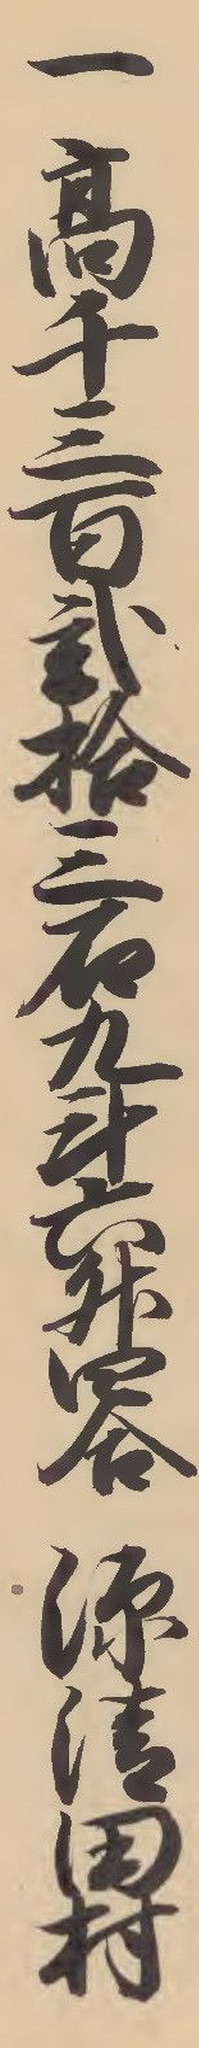一高千三百弐拾三石九斗六升四合源清田村

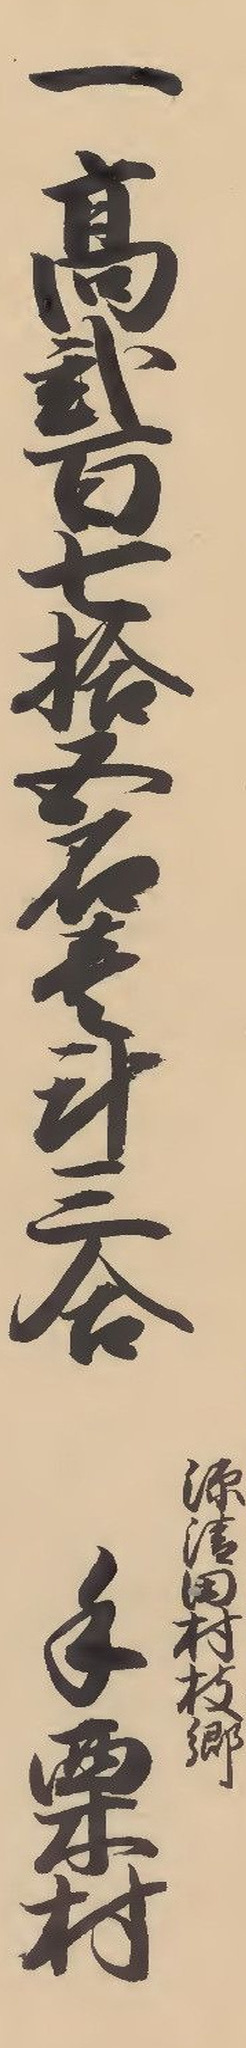一高弐百七拾五石壱斗三合手栗村
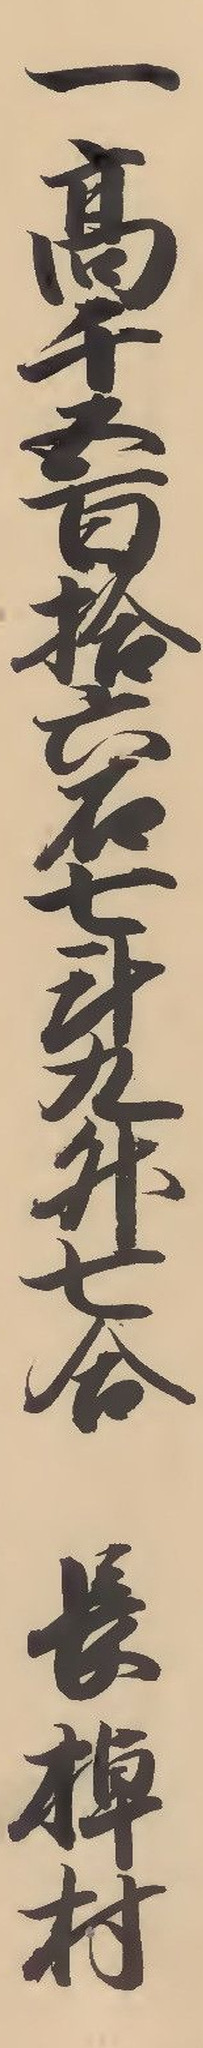一高千五百拾六石七斗九升七合長棹村
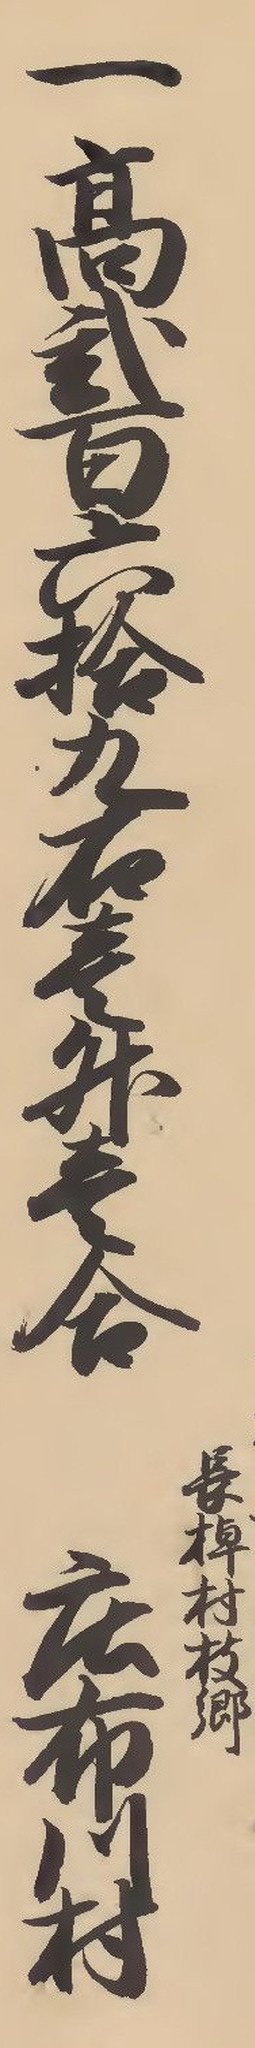一高弐百六拾九石壱升壱合庄布川村
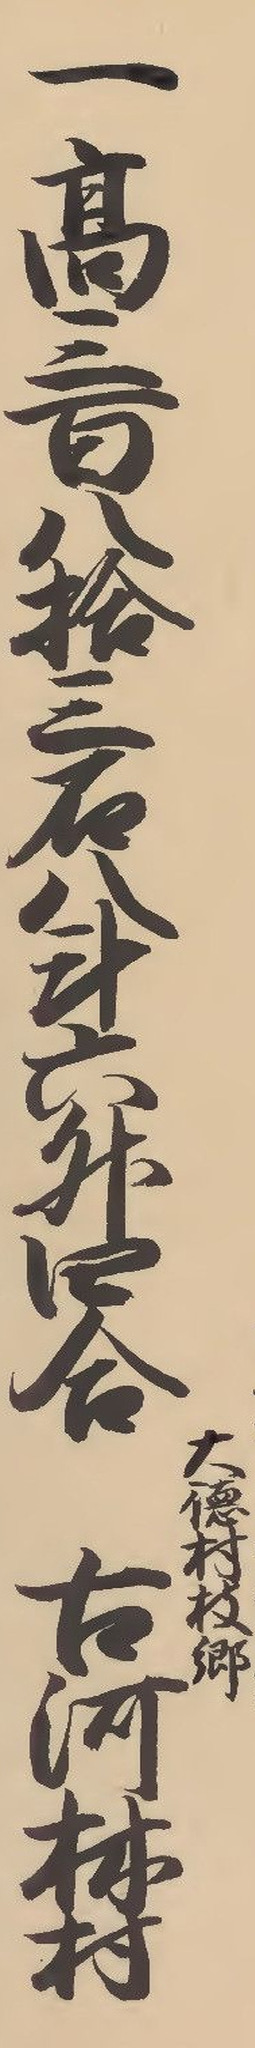一高三百八拾三石八斗六升四合古河林村
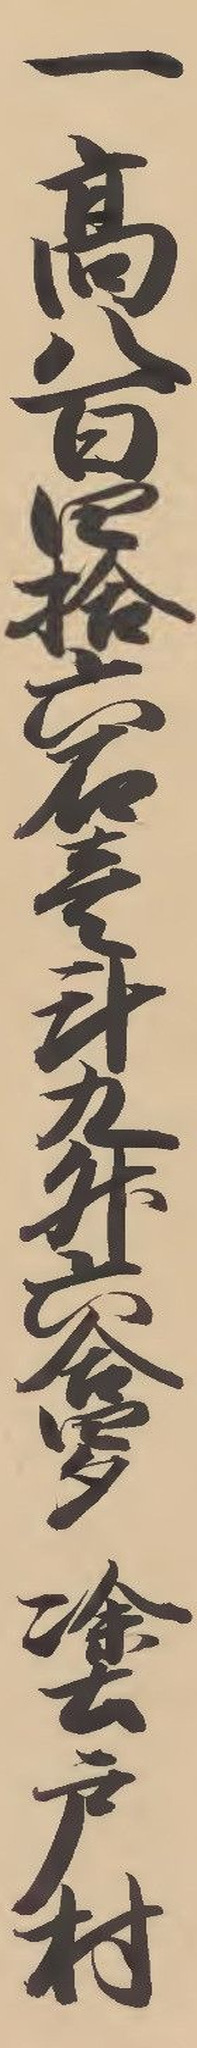一高八百四拾六石壱斗九升六合四勺塗戸村
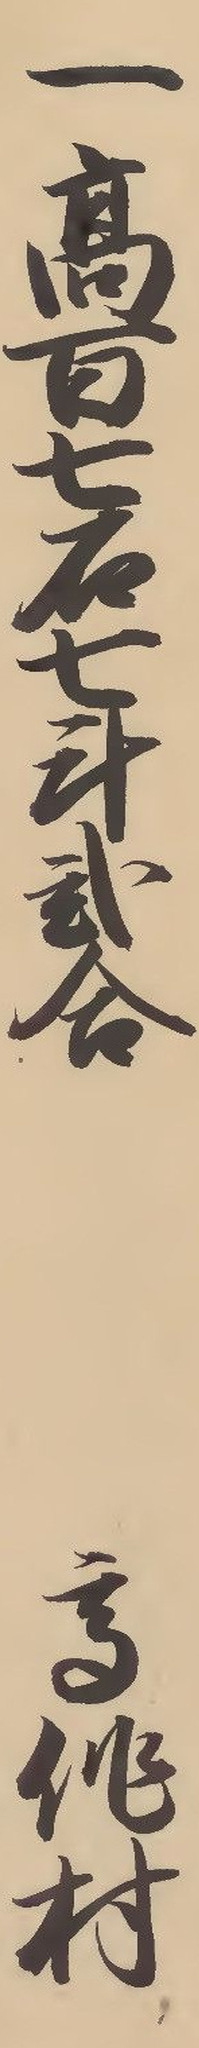一高百七石七斗弐合高作村
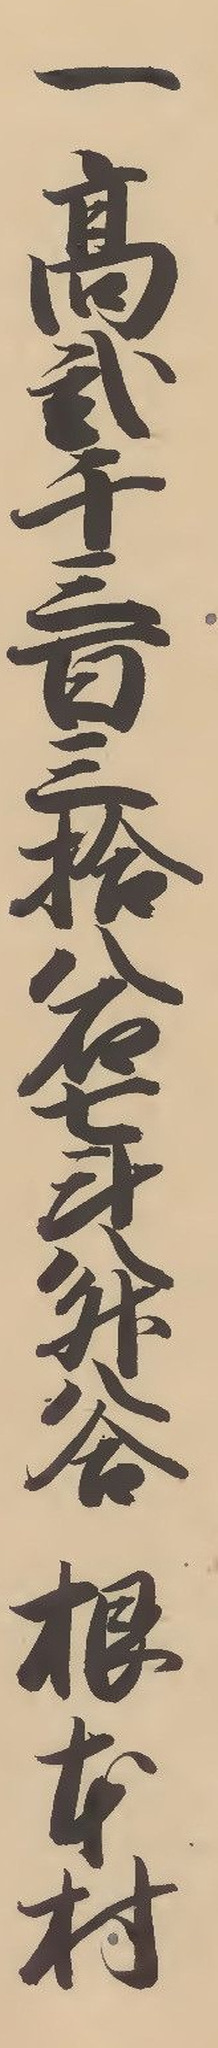一高弐千三百三拾八石七斗八升八合根本村
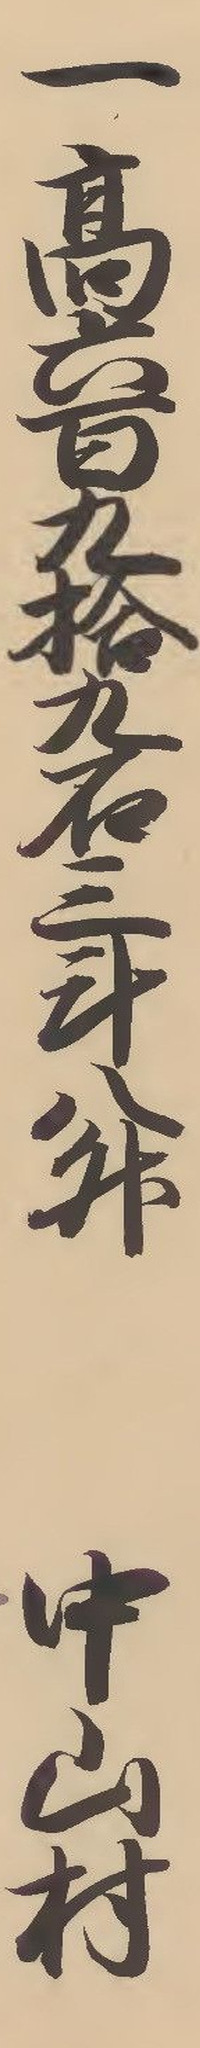一高六百九拾九石三斗八升中山村

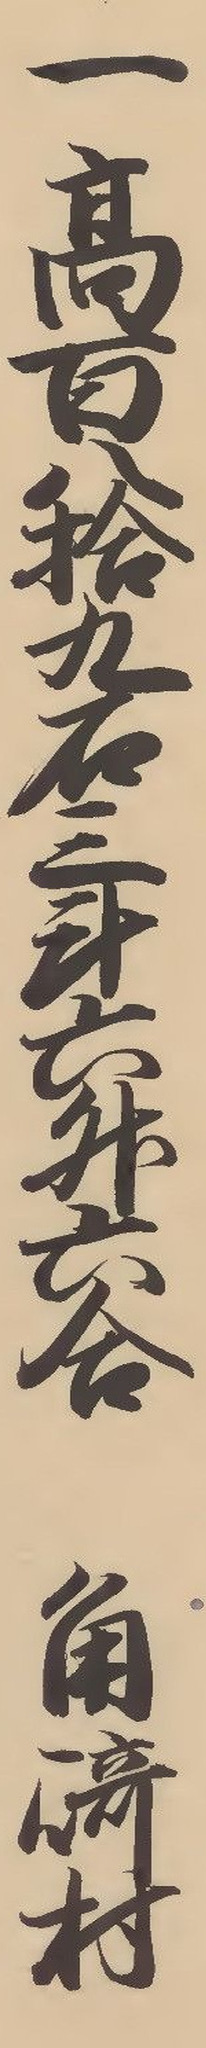一高百八拾九石三斗六升六合角崎村
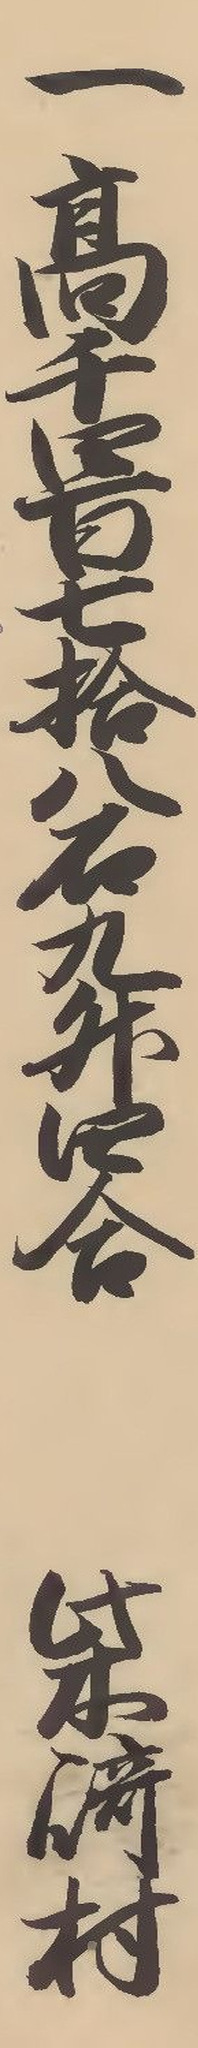一高千四百七拾八石九升四合柴崎村
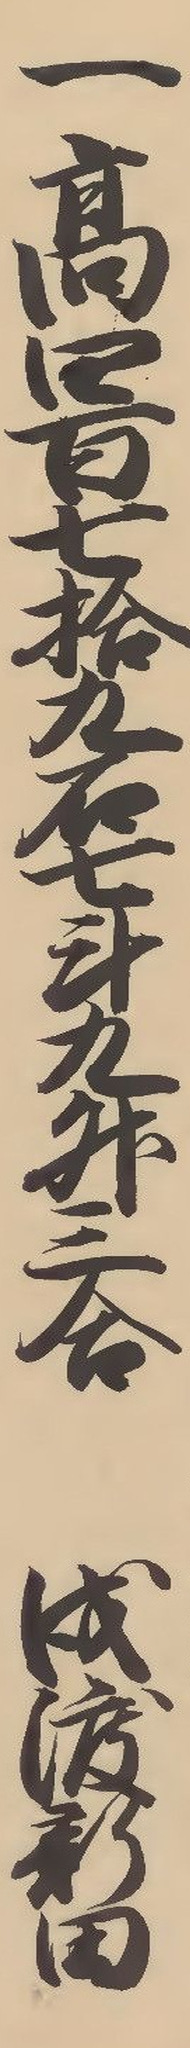一高四百七拾九石七斗九升三合戌渡新田
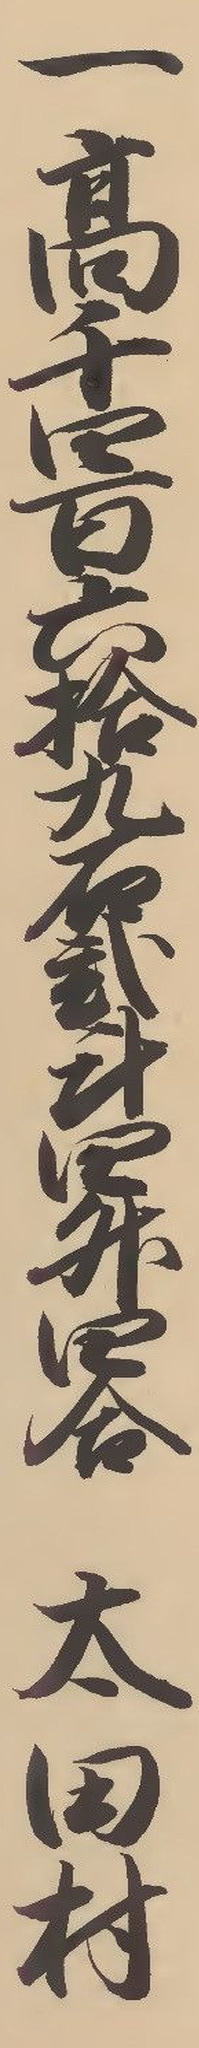一高千四百六拾九石弐斗四升四合太田村
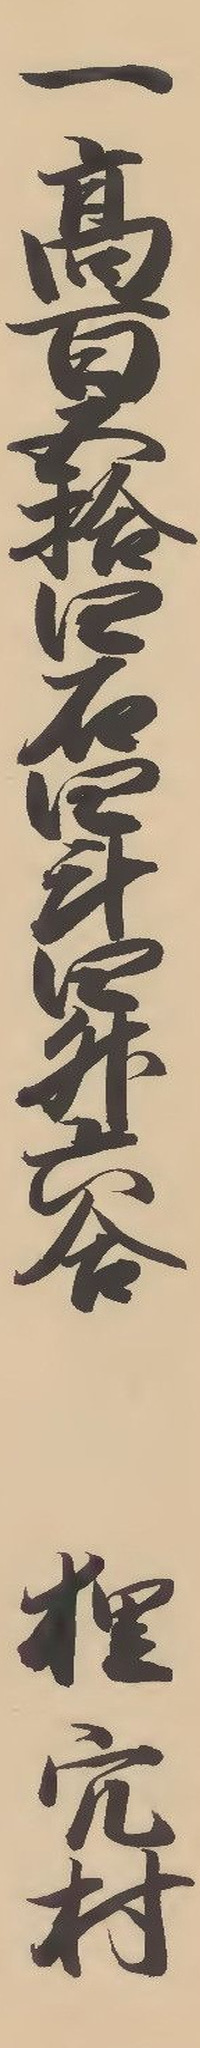一高百五拾四石四斗四升六合狸穴村
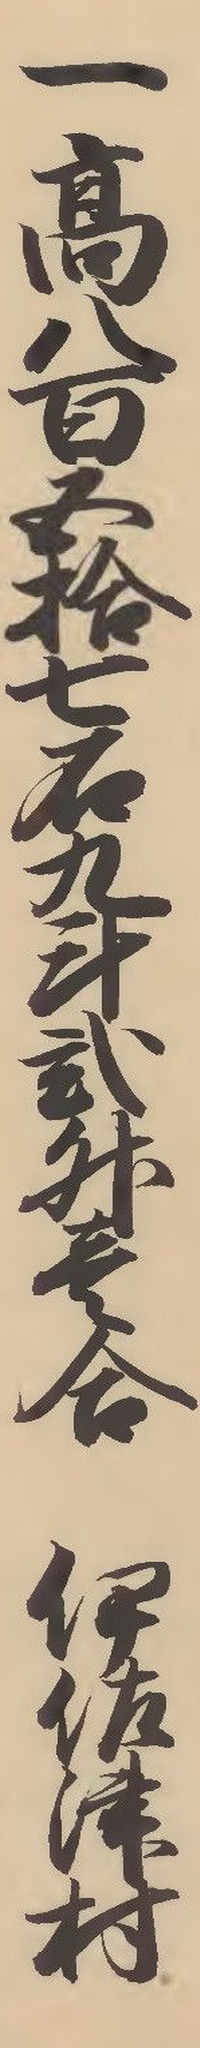一高八百五拾七石九斗弐升壱合伊佐津村
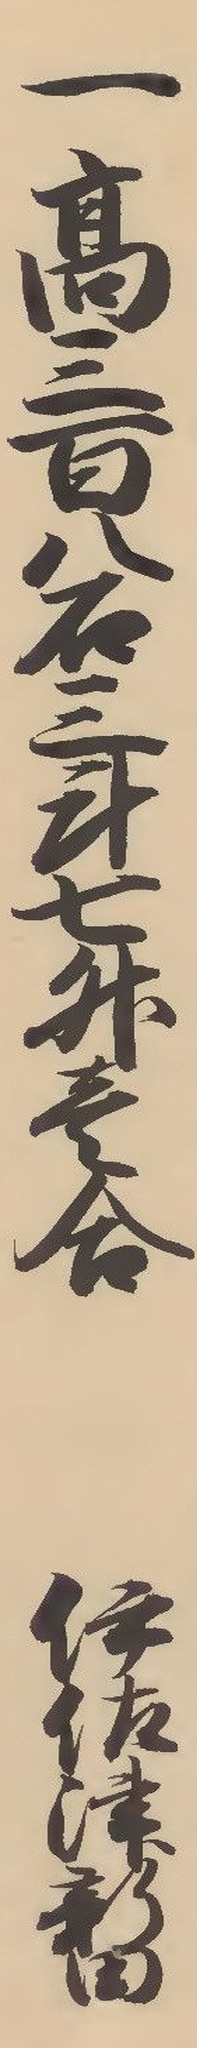一高三百八石三斗七升壱合伊佐津新田
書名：常陸国郷帳
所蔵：国立公文書館 National Archives of Japan
